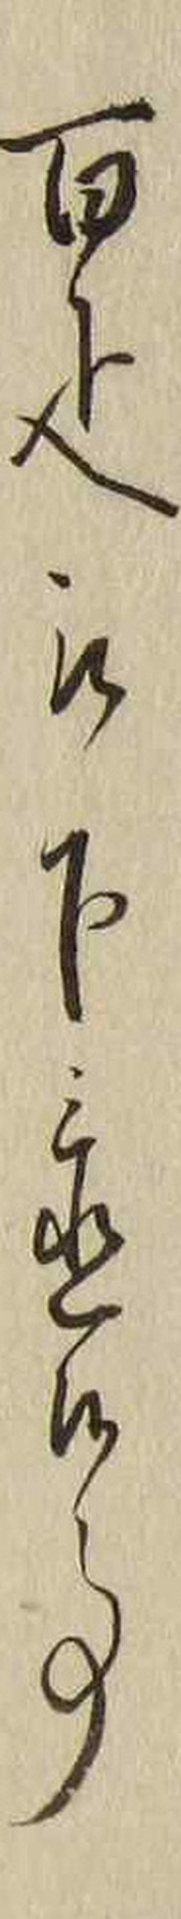百疋被下置候事

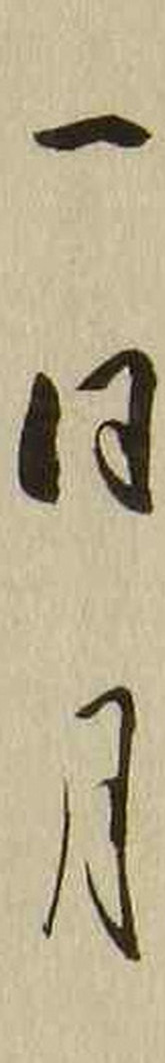一同月
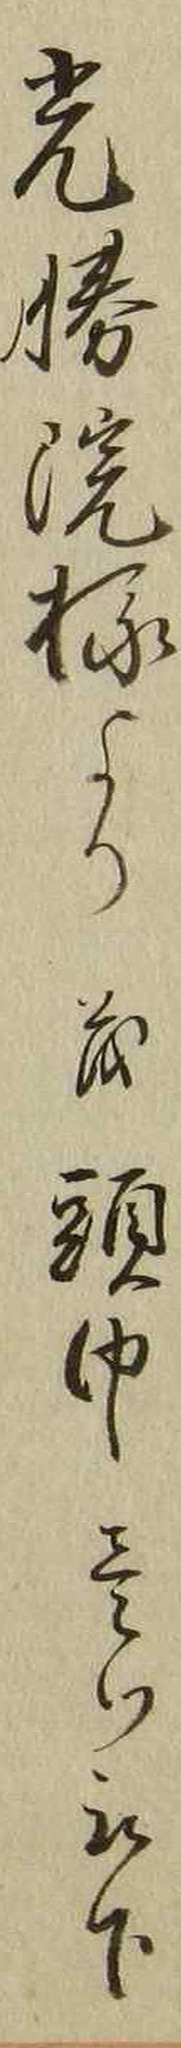光勝院様より茂頭巾壱ツ被下
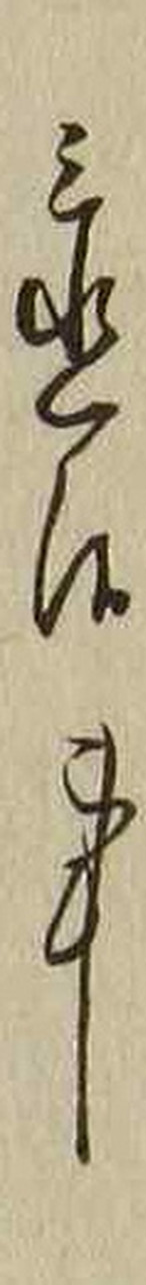置候事
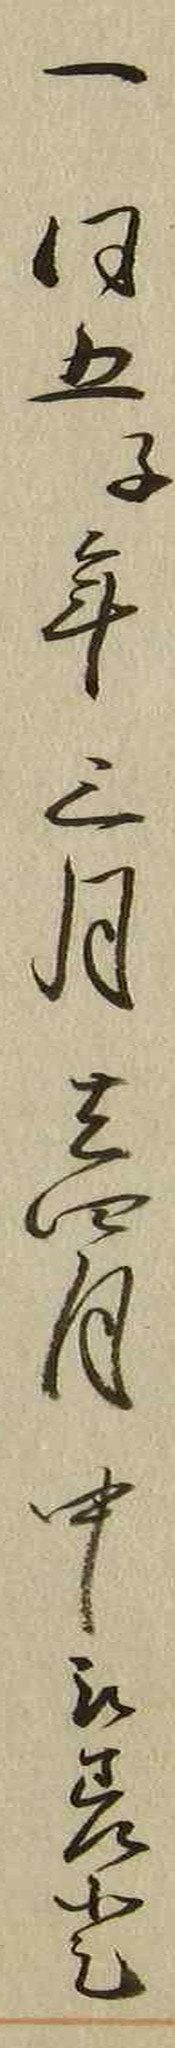一同五子年三月去四月中被差登
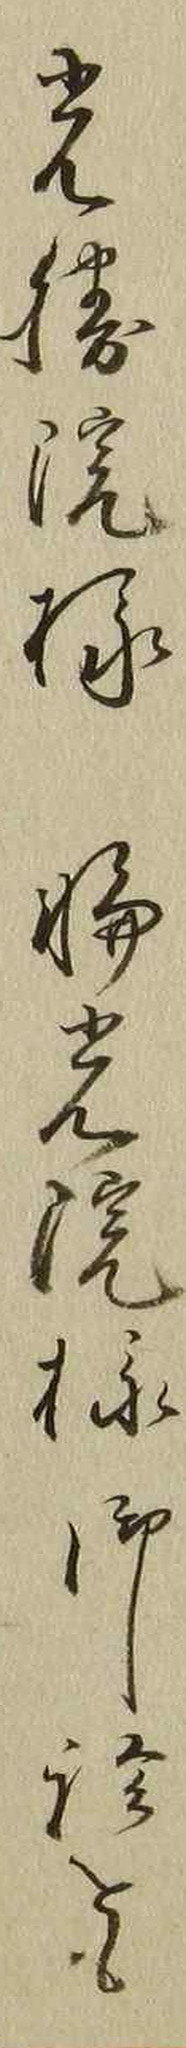光勝院様輪光院様御診をも
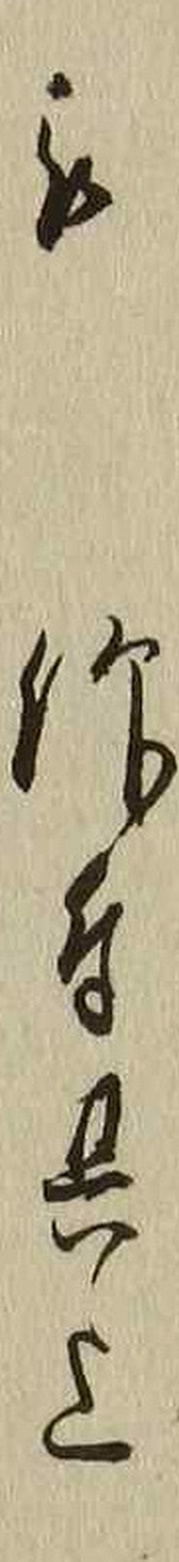被仰付其上
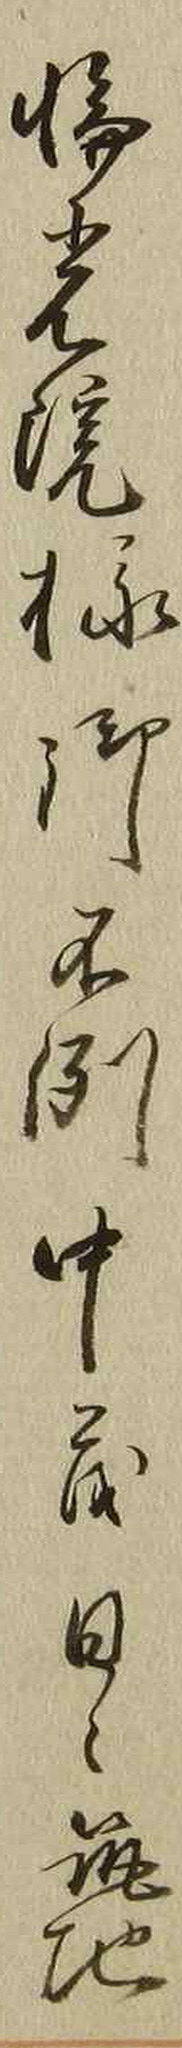輪光院様御不例中茂日々築地江
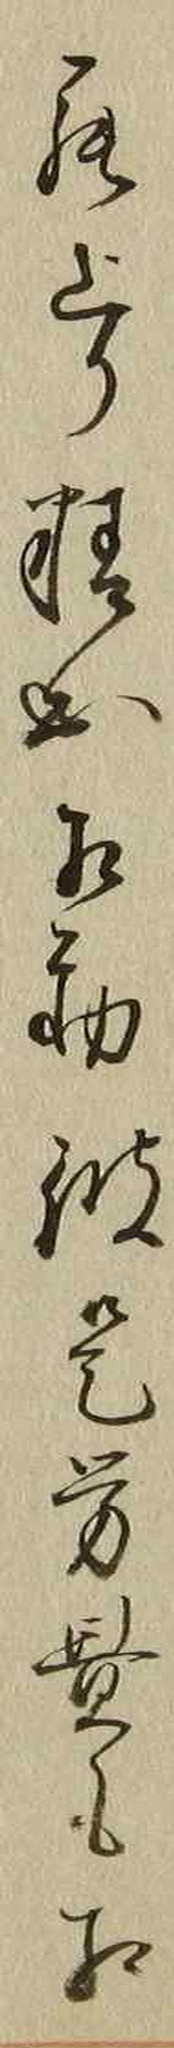罷上り精出相勤彼是労費も相
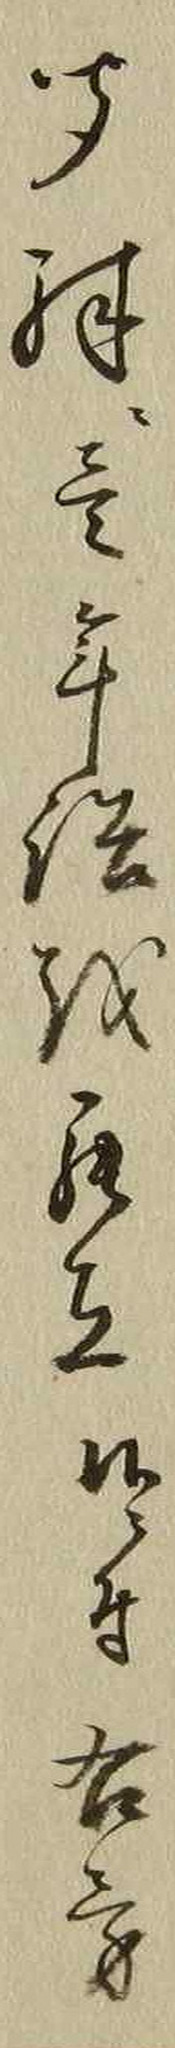聞殊ニ壱年詰を罷在候ニ付右旁
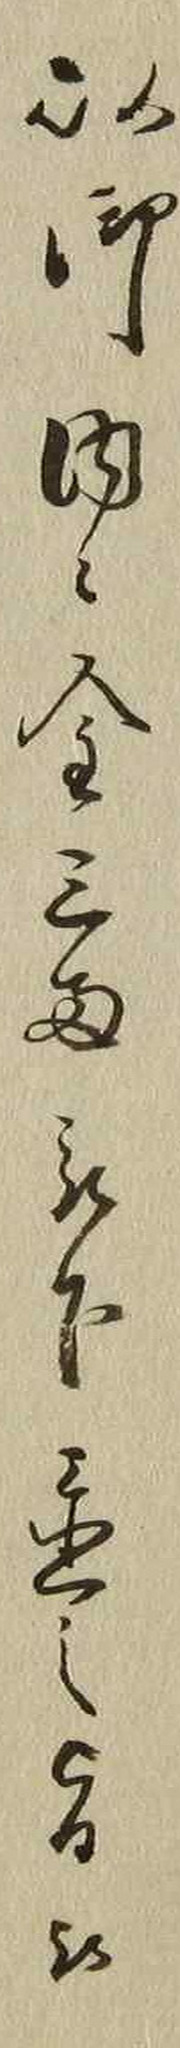以御内々金三両被下置之旨被
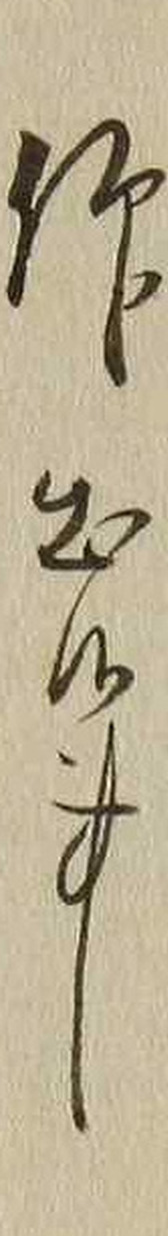仰出候事
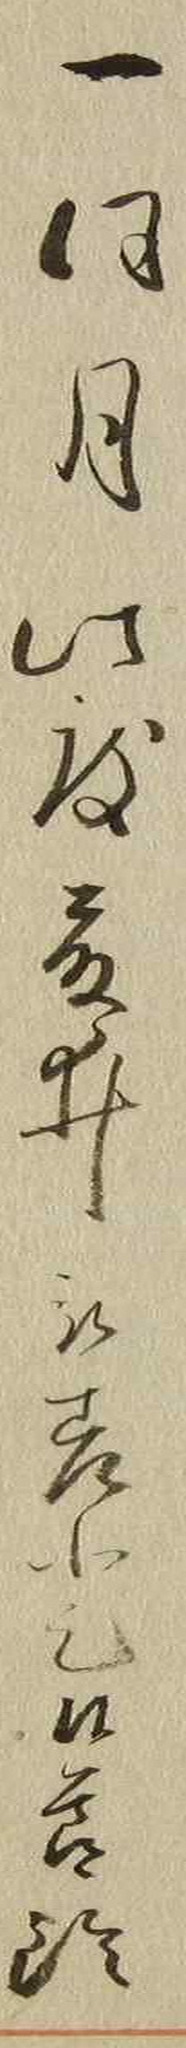一同月此度藤井被差登候節頭
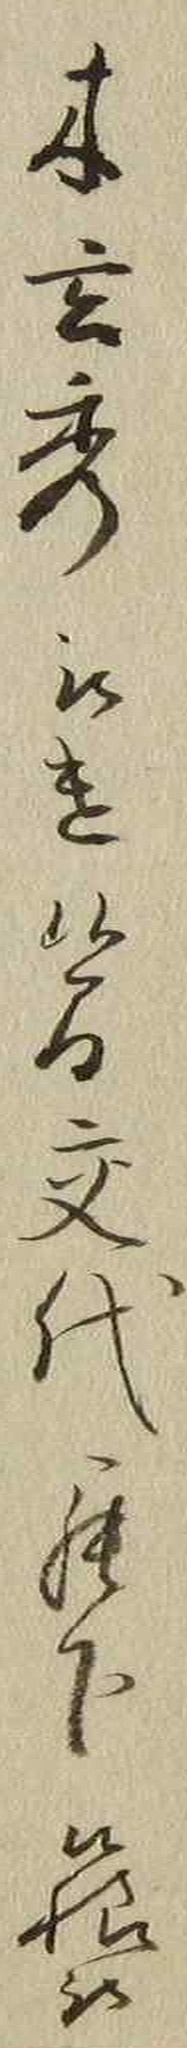木玄秀被遣候間交代罷下候様被
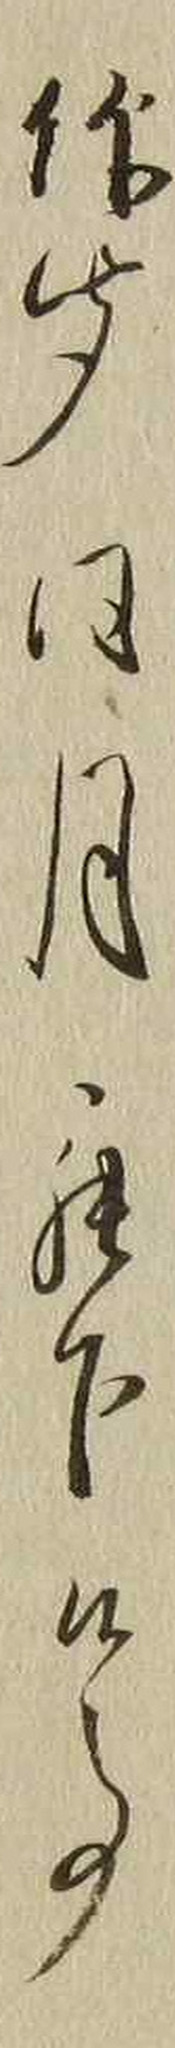仰聞同月罷下候事
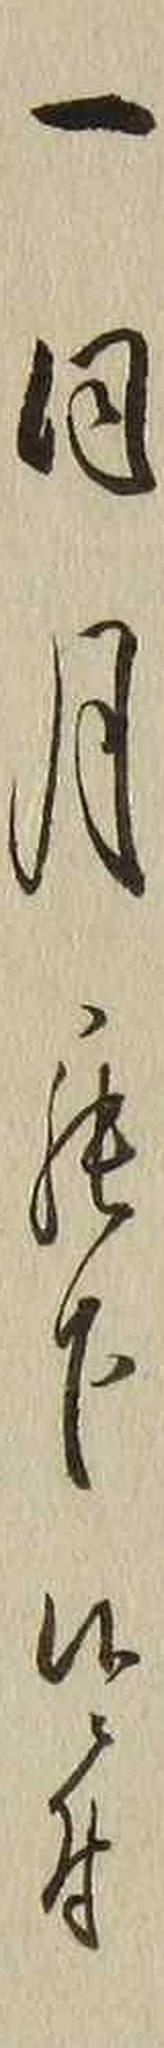一同月罷下候ニ付
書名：諸士系譜　巻之68　を之部2
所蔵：会津若松市立会津図書館
